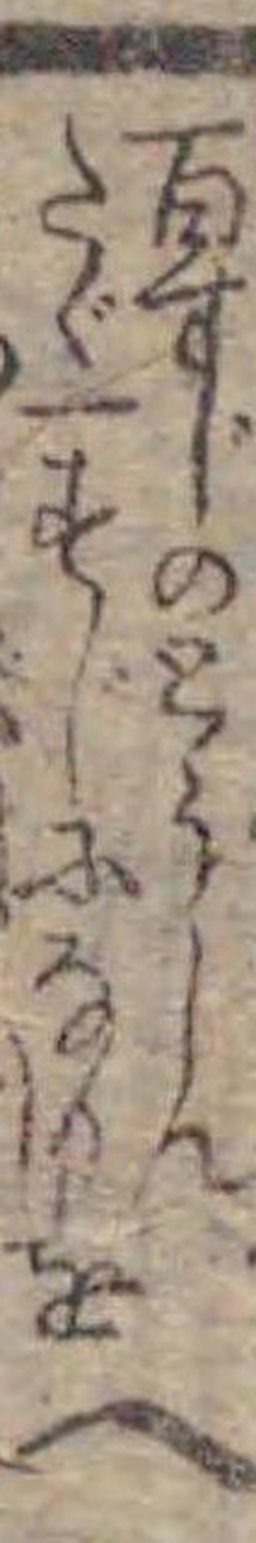たゞ一すじになりしを
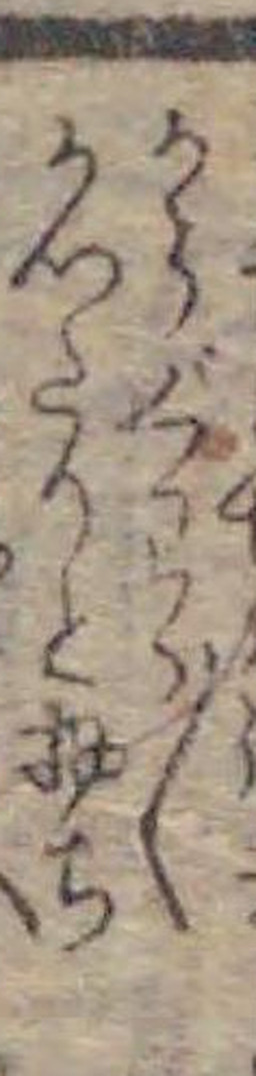かつたりとおち
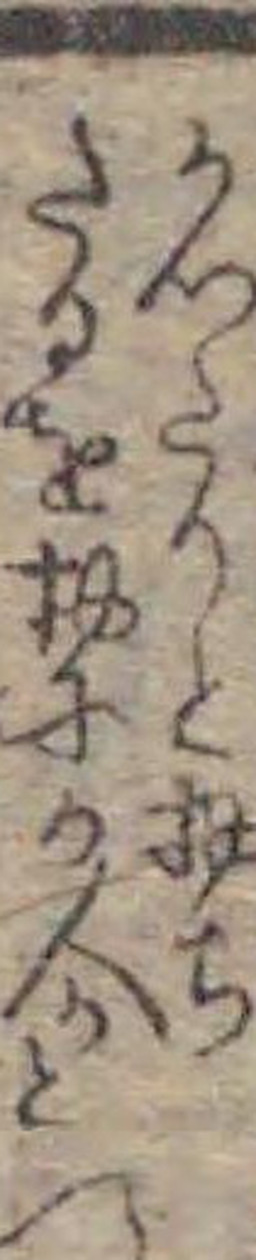たるをおにか人かと
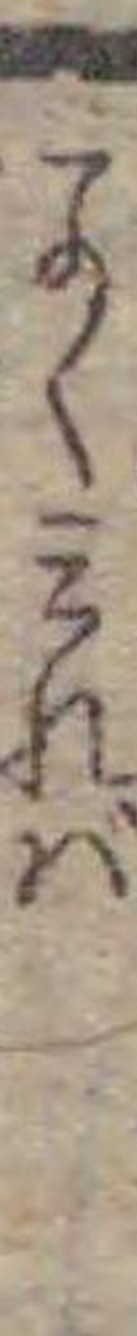よくみれば
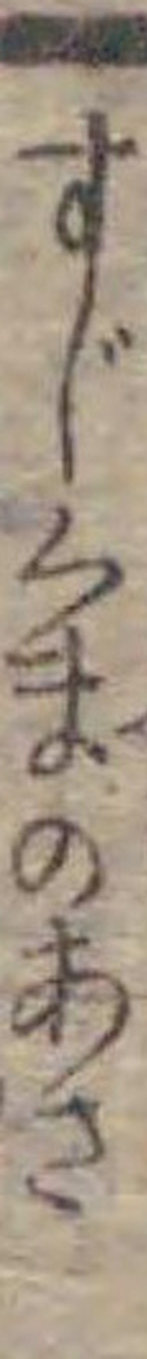すじくまのあさ
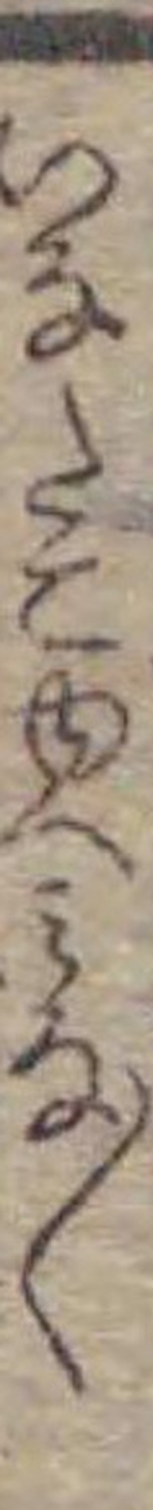いなたこゆへみな〳〵
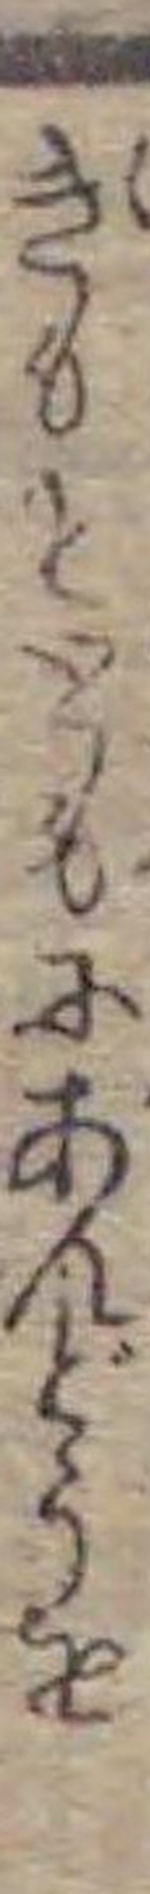きもとともにあんどうを
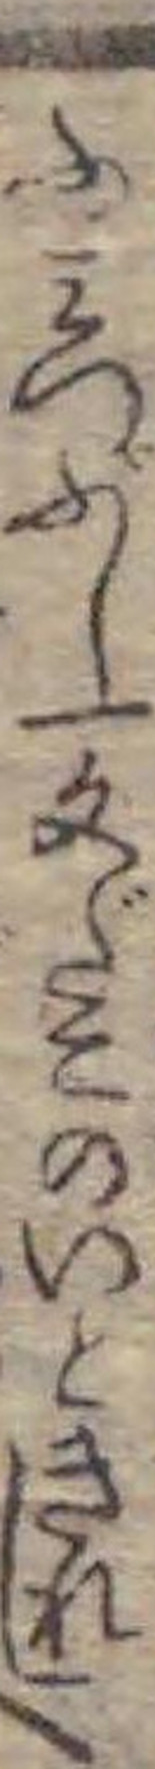ふみつぶし一文だこのいときれし
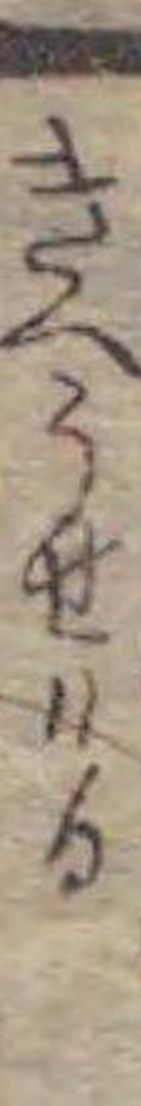きへうせける
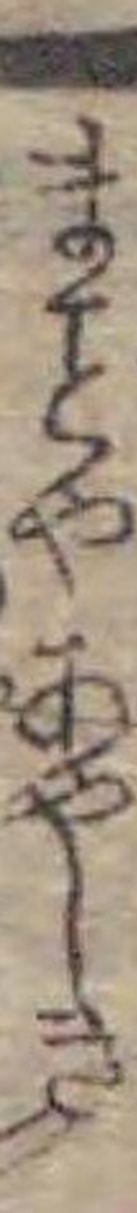まことやあやしき
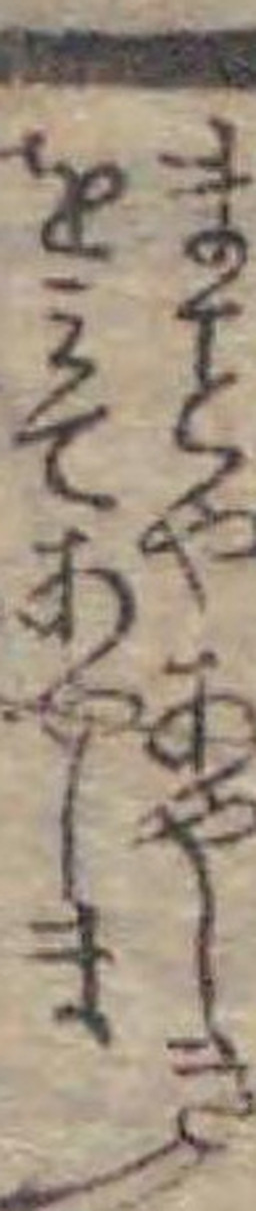をみてあやしま
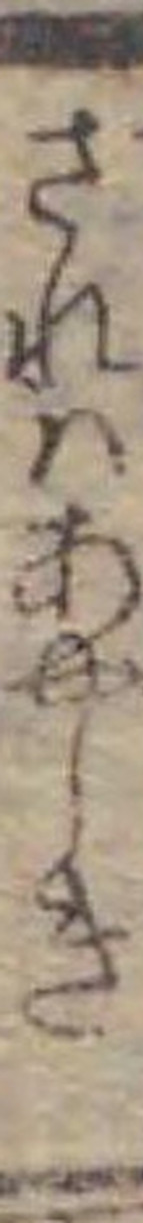されはあやしき
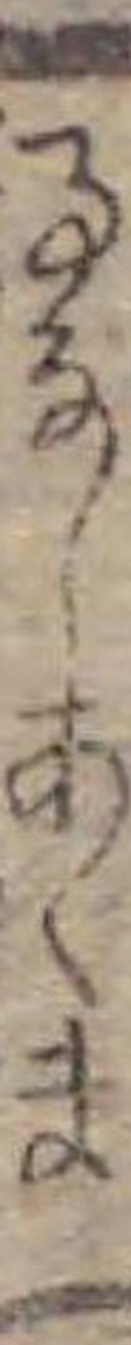事なしあくま
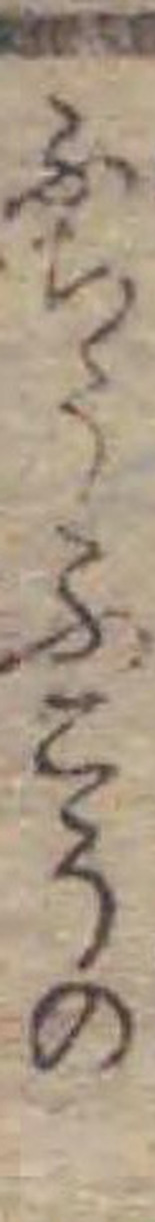ふちうふこうの
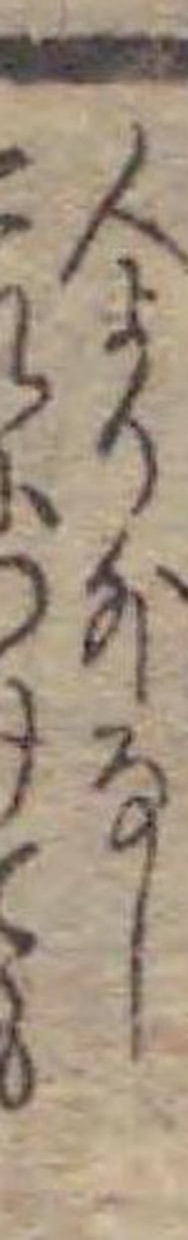人より外なし
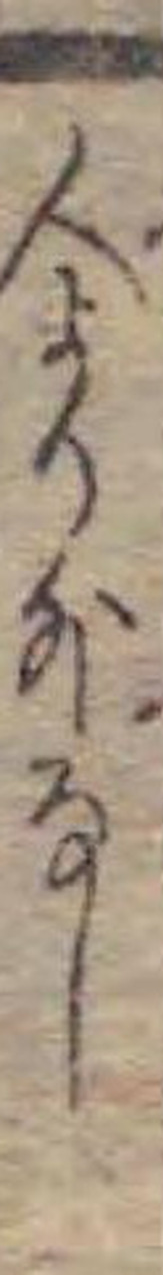人より外なし
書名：怪物つれつれ草 : 2巻
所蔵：国立国会図書館 National Diet Library, JAPAN
